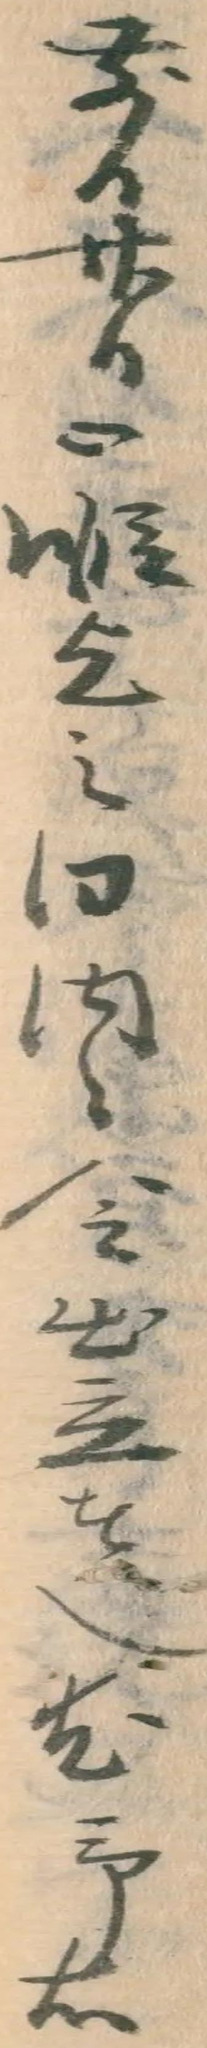前日廿日御暇乞之日、内々令出立奉候、尤予右
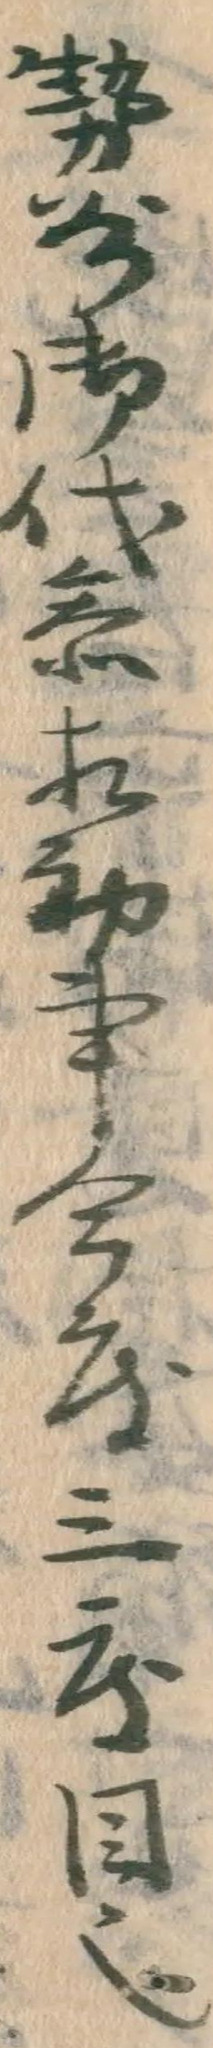勢州御代参相勤事、今度三度目也、
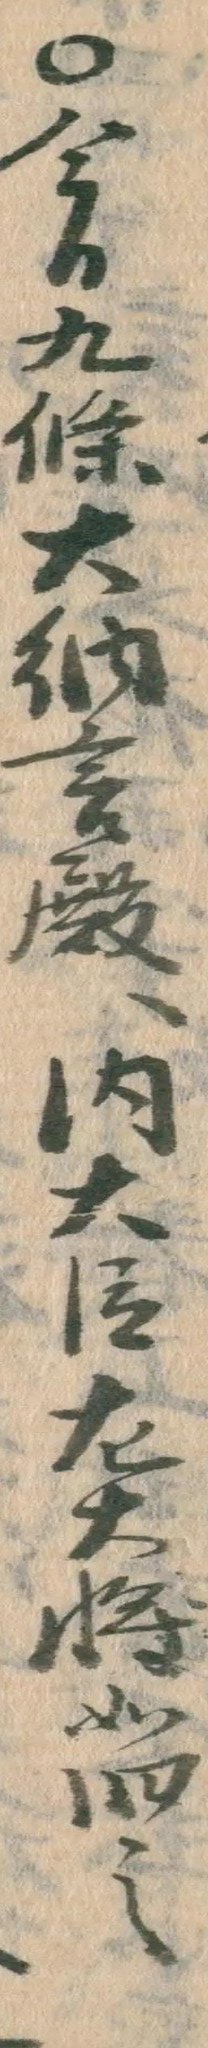○今日九條大納言殿へ内大臣左大将如旧之
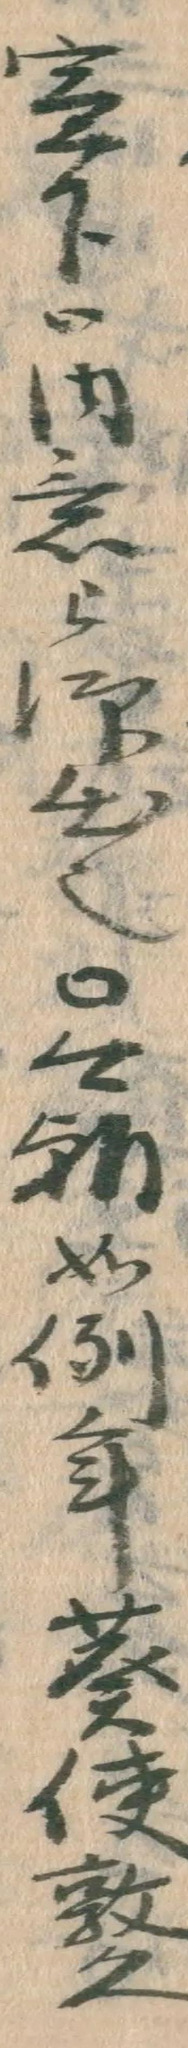宣下、御内意被仰出也、○今朝如例年葵使敦久・
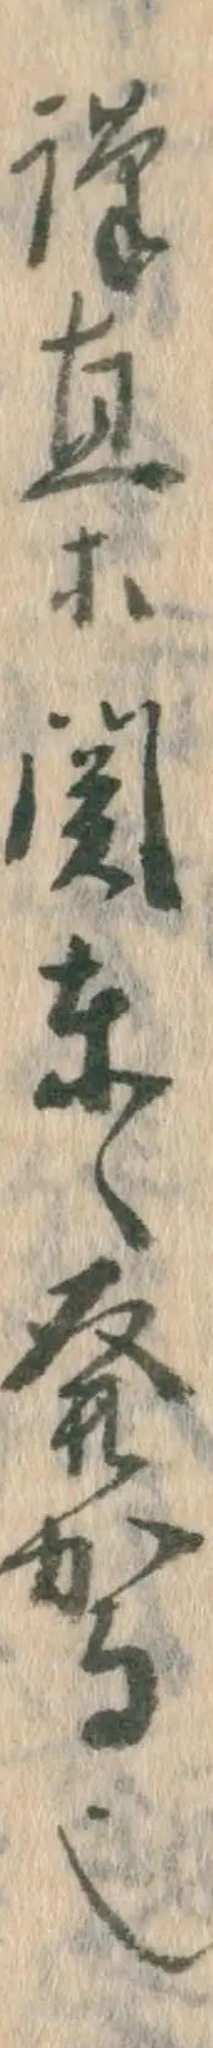謹直等関東へ発駕也、
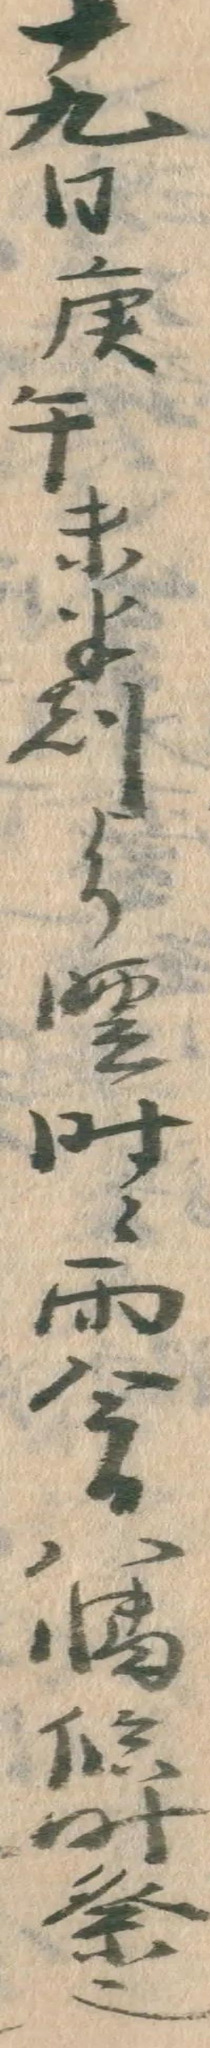十九日庚午未半刻より曇、時ニ雨、今日八幡臨時祭也、
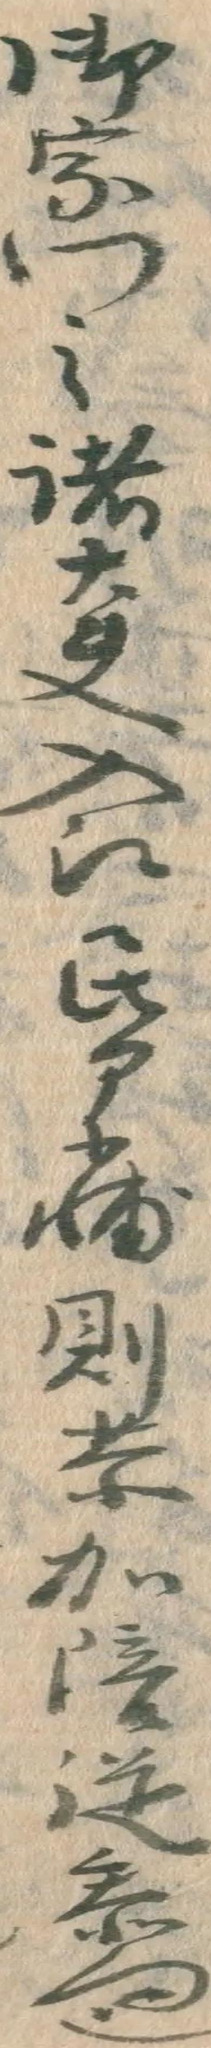御家門之諸大夫入江民部小輔則泰、加陪従参向也、
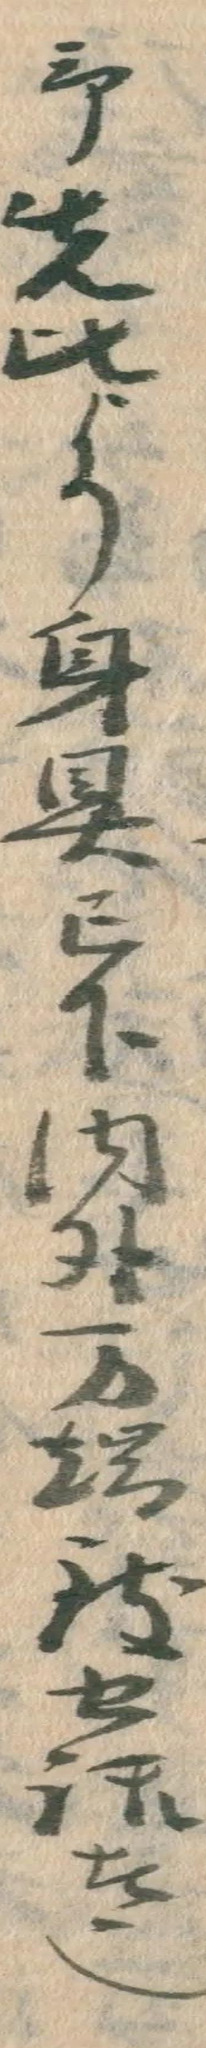予先比より身具已下内外万端被世話在也、
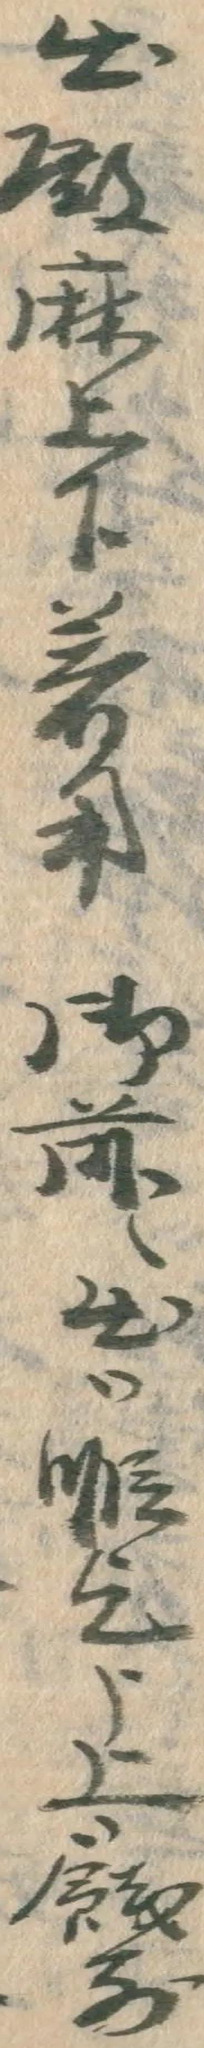出殿、麻上下着用、御前へ出御暇乞申上、御餞別
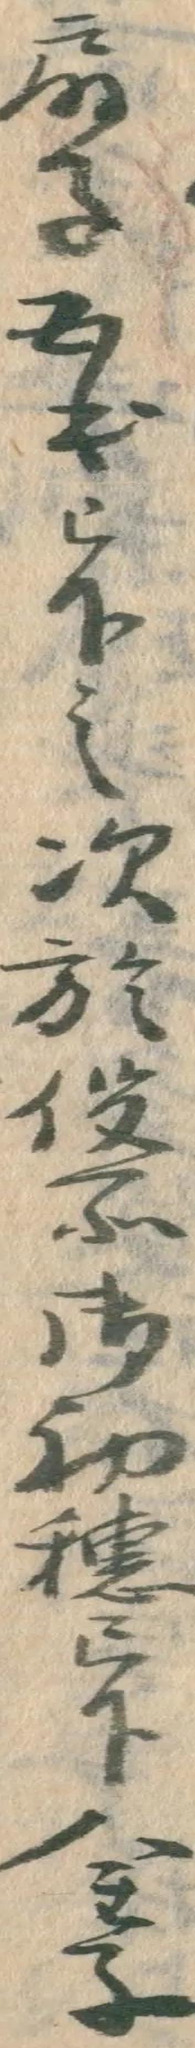扇子五本被下之、次於役所御初穂被下、金子
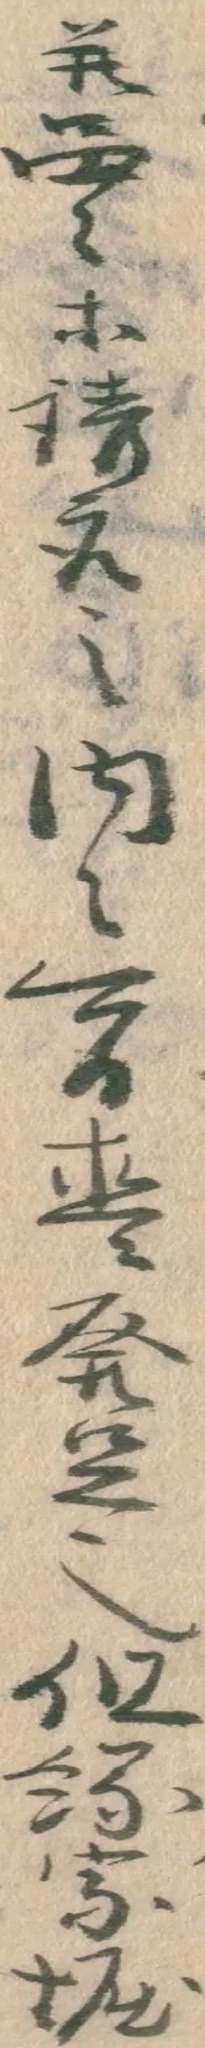幷品々等請取之、内〻今日直に発足也、但縁家堀
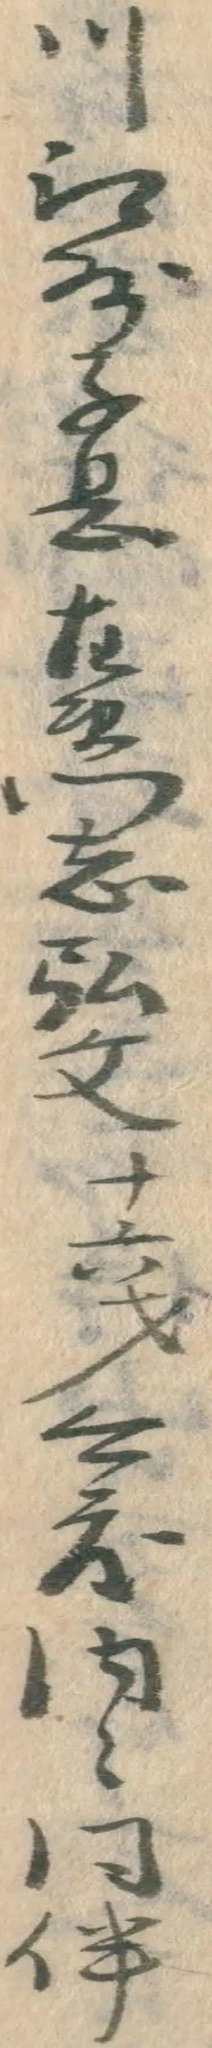川江州子息左衛門志弘文十六才、今度内々同伴

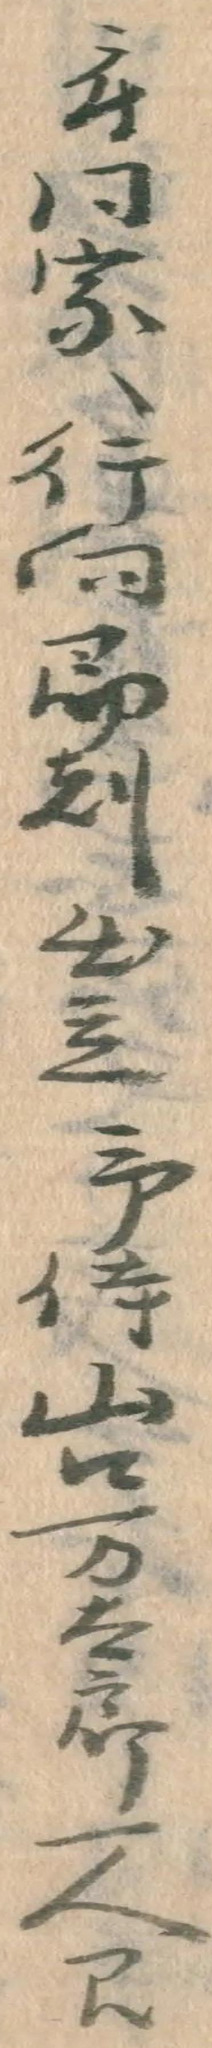ニ付、同家へ行向即刻出立、予侍山口万太郎一人召
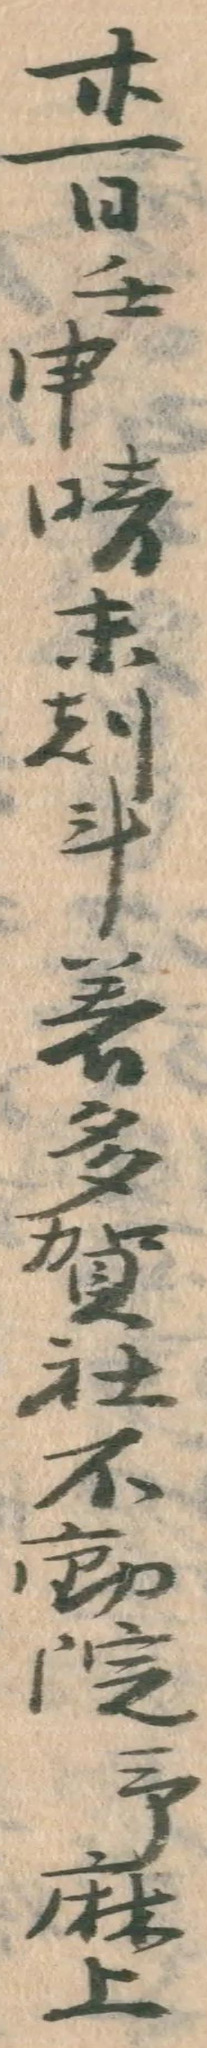廿一日壬申晴、未刻斗着多賀社不動院、予麻上
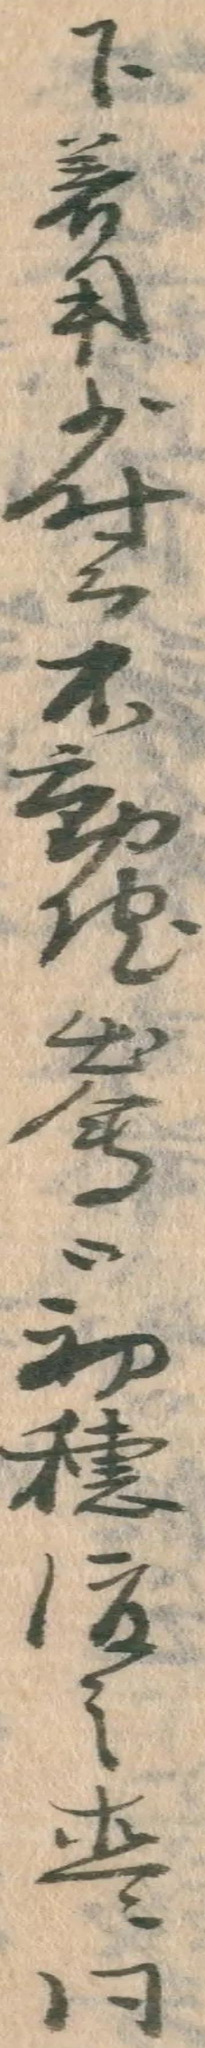下着用、少時而不動院出會、御初穂渡之、直ニ同
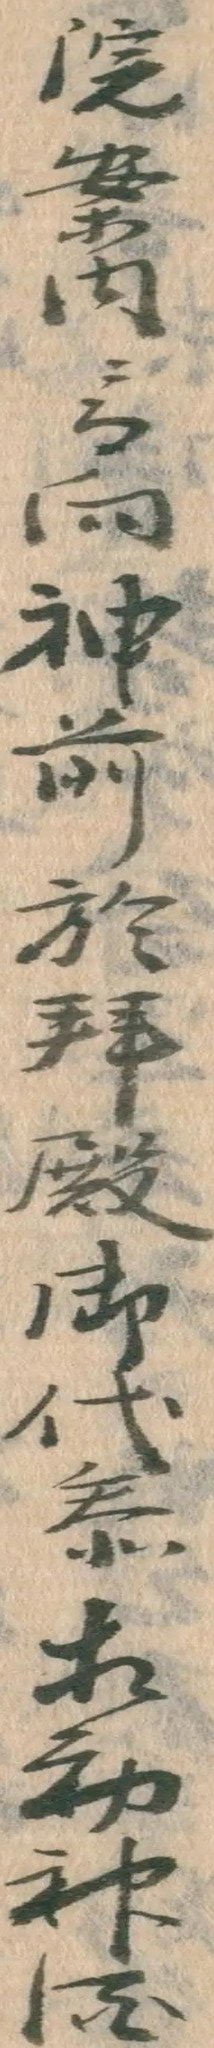院案内ニ而、向神前於拝殿御代参相勤、神酒
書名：賀茂社記録. 第63冊
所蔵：国立国会図書館 National Diet Library, JAPAN
